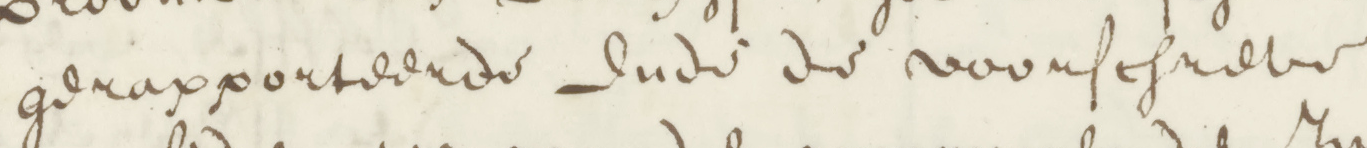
gerapporteerde ende de voorschreve
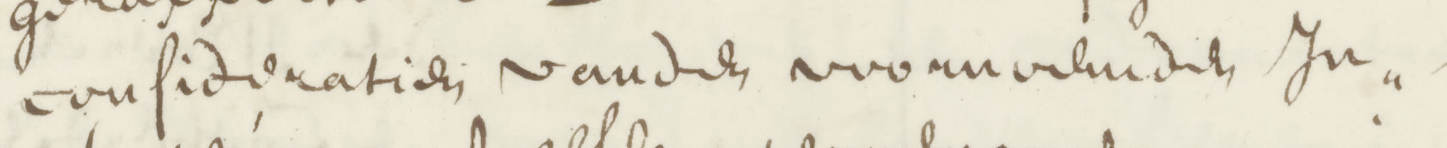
consideratien vanden voornoemden In„
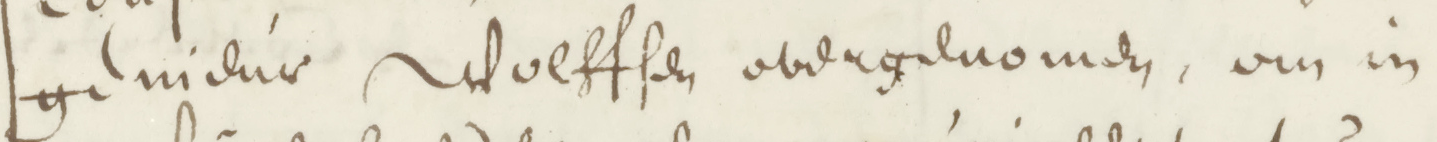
genieur Wolffsen overgenomen, om in
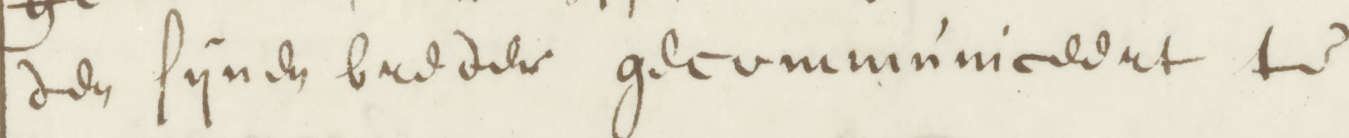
den sijnen breder gecommuniceert te
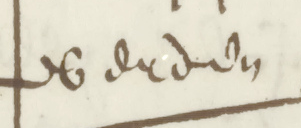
werden.
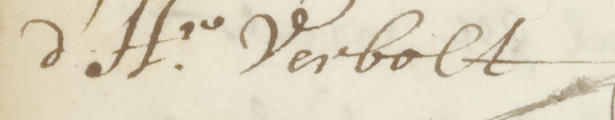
d'Hr. Verbolt
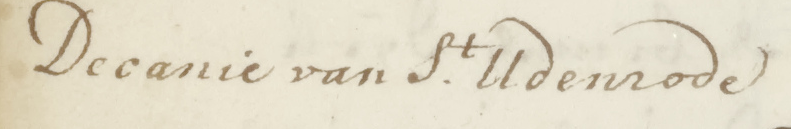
Decanie van St. Udenrode
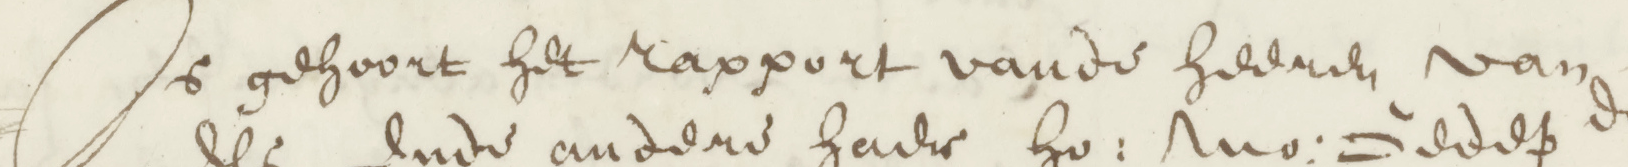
Is gehoort het rapport vande heeren van
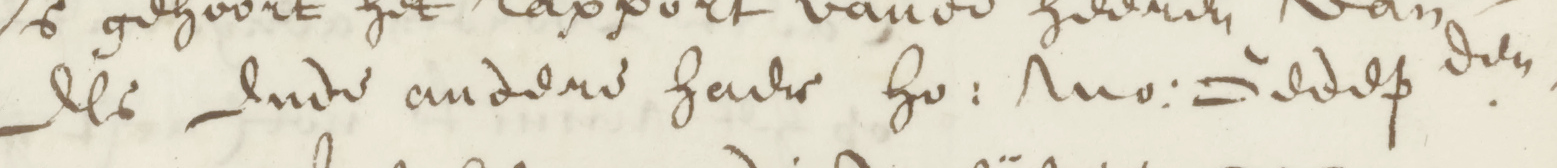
Els ende andere haer ho:Mo: Gedepden.
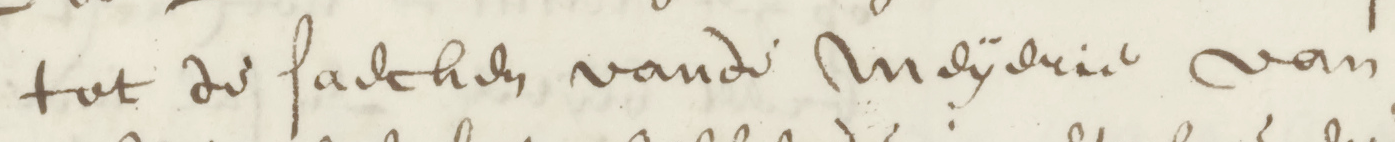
tot de saecken vande Meijerie van
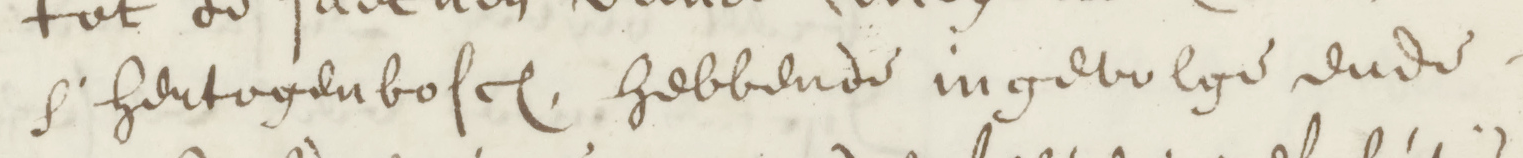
s‛hertogenbosch, hebbende ingevolge ende
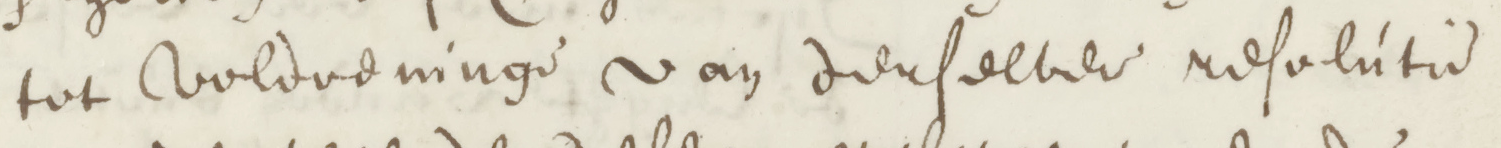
tot voldoeninge van derselver resolutie
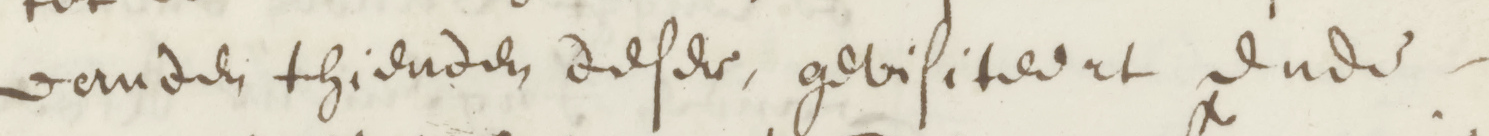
vanden thienden deser, gevisiteert ende
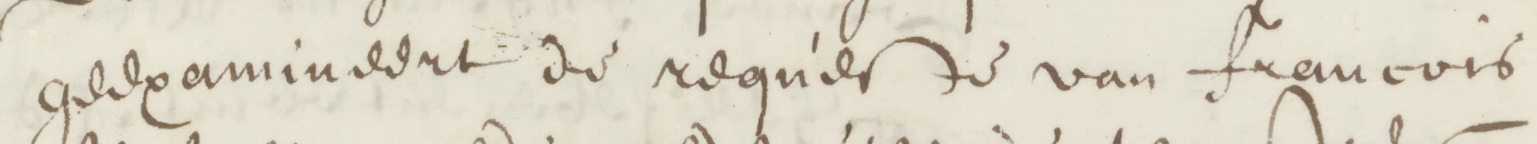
geexamineert de requeste van Francois
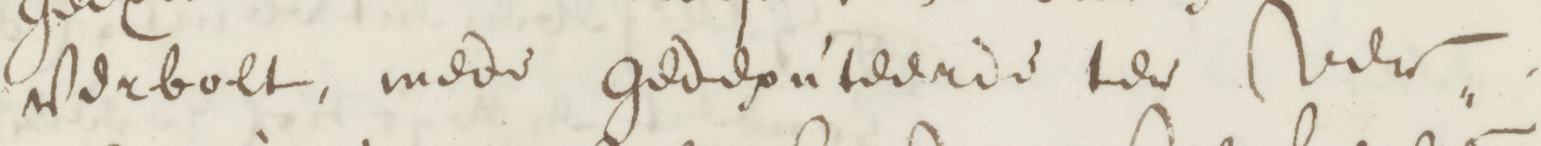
Verbolt, mede gedeputeerde ter Ver„
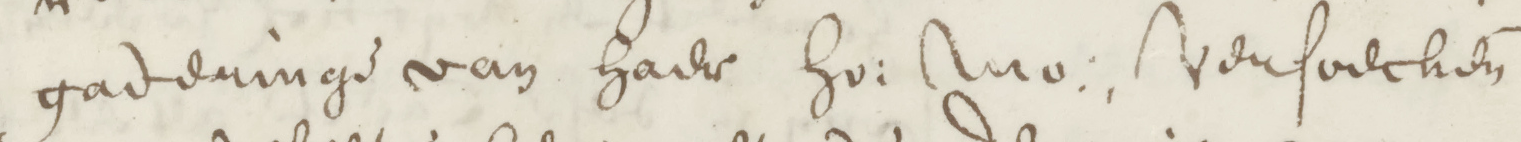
gaderinge van haer ho:Mo: versoecken
